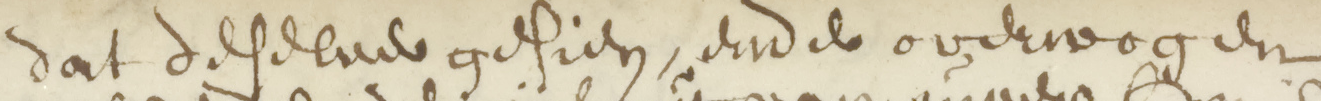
dat deselve gesien, ende overwogen
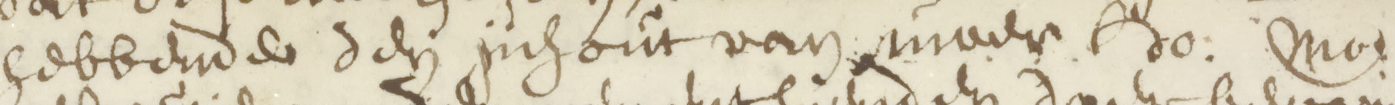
hebbende den inhout van uwer Ho:Mo:
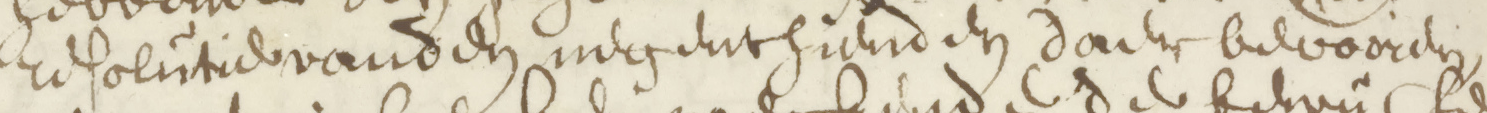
resolutie vanden negenthienden daer bevooren,
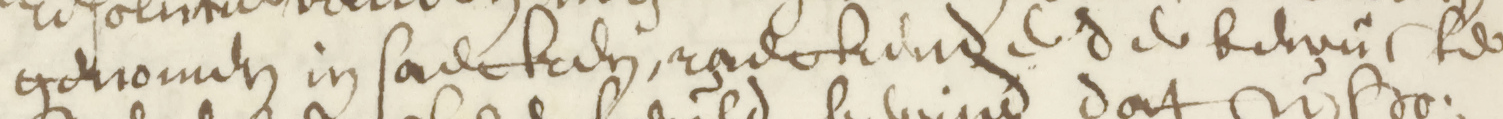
genomen in saecken, raeckende de bewuste
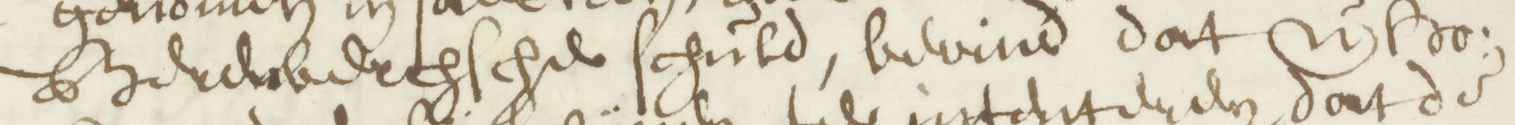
Berenberchsche schuld, bevind dat U Ho:
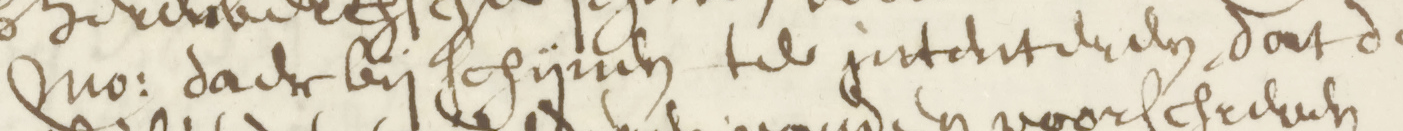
Mo: daer bij schijnen te intenteren, dat de
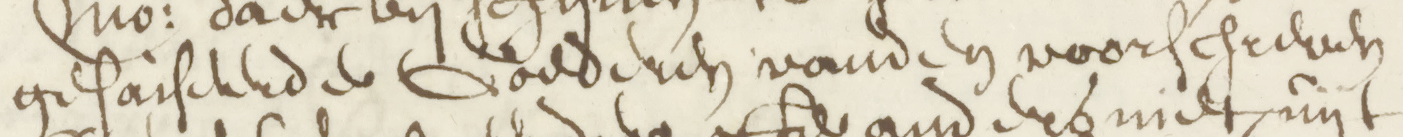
gesaiseerde Goederen vanden voorschreven
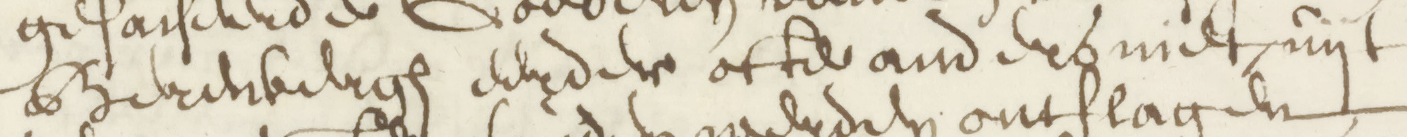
Berenbergh eerder ofte anders niet uijt
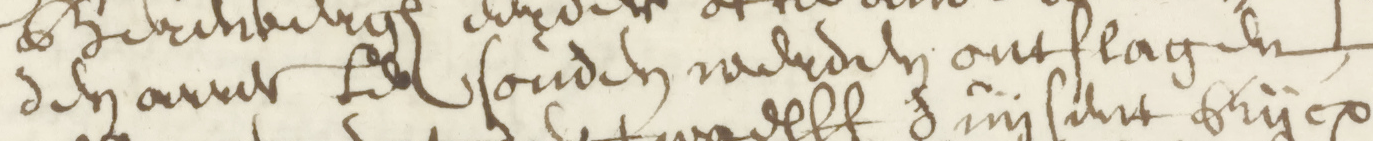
den arreste souden werden ontslagen,
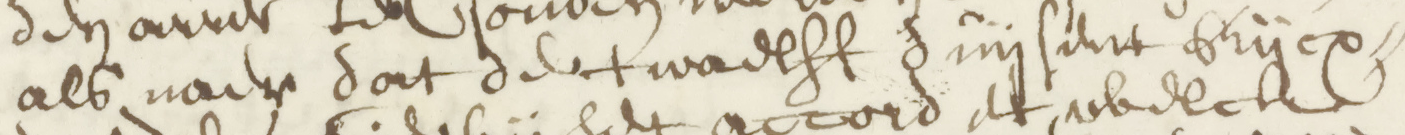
als naer dat de twaelff duijsent Rijcx„
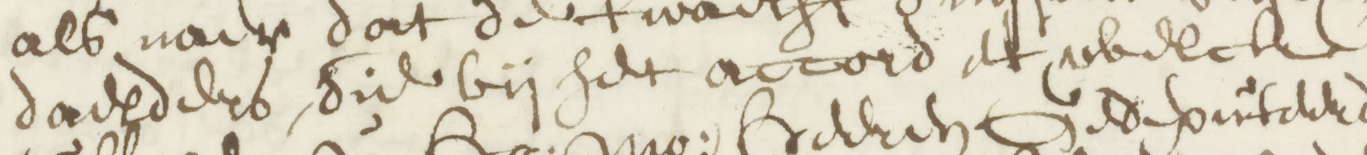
daelders, die bij het accord ‛t welck
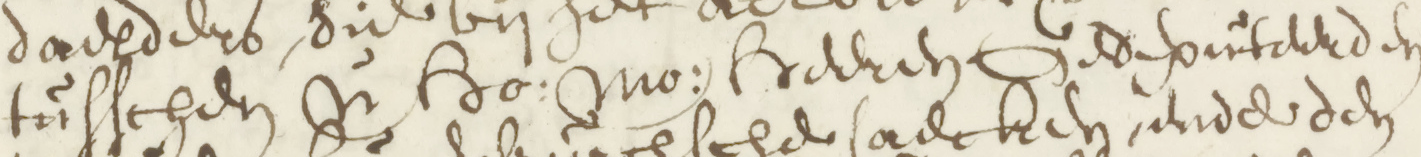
tusschen U Ho:Mo: Heeren Gedeputeerden
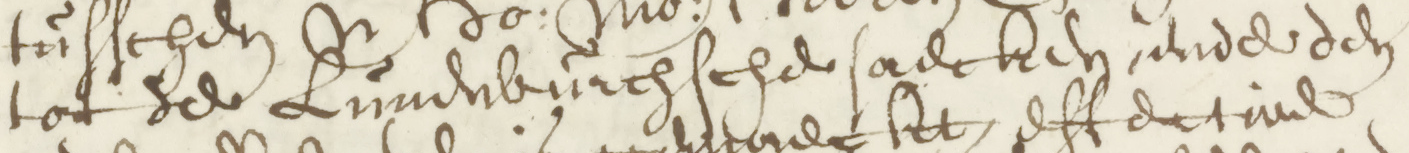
tot de Lunenburchsche saecken, ende den
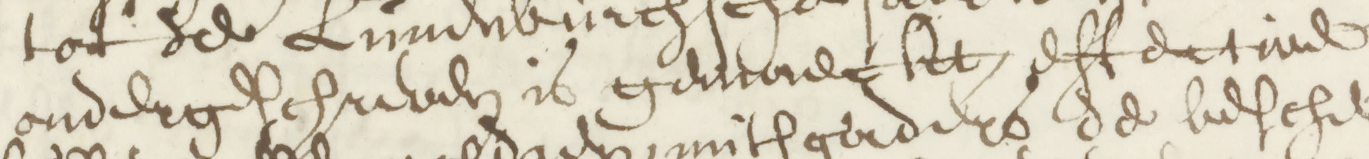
ondergeschreven is gemaeckt, effective
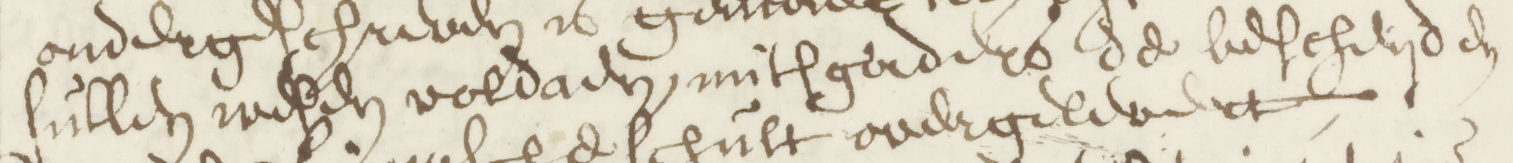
sullen wesen voldaen, mitsgaders de bescheijden
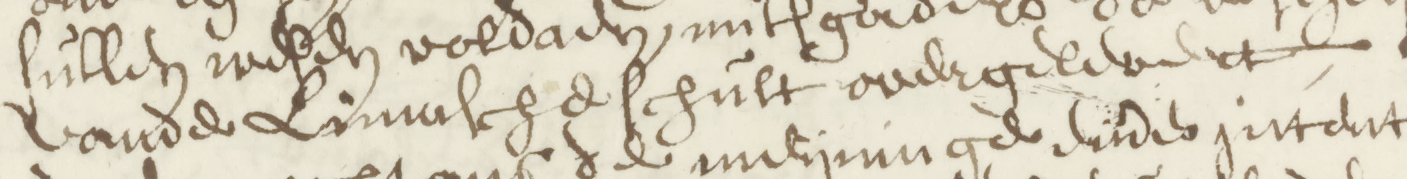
vande Lunesche schult overgelevert,
